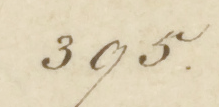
395.
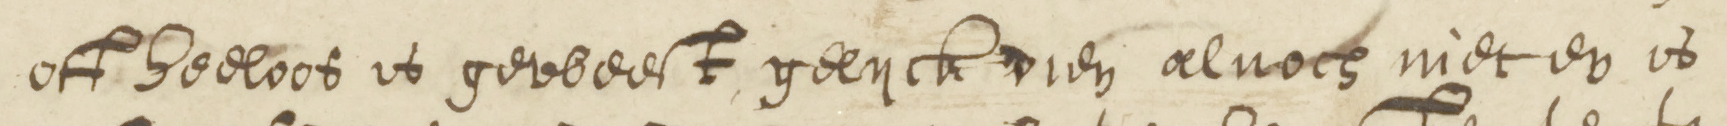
off heeloos is geweest, gelyck dien alnoch niet en is
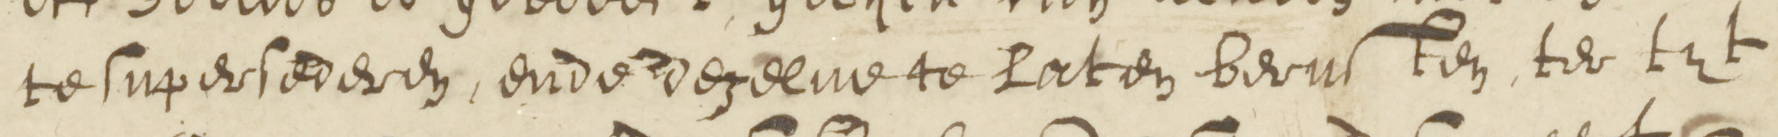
te supersederen, ende deselue te laten berusten, ter tyt
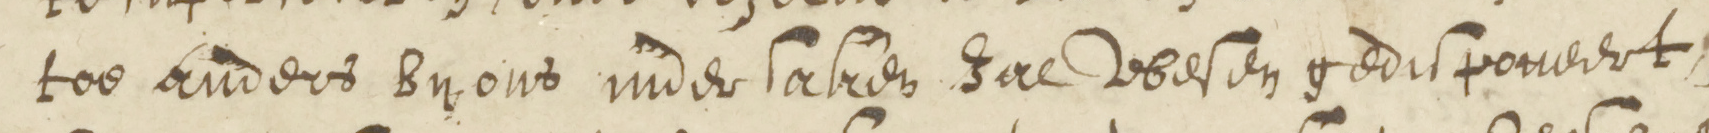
toe anders by ons inder saken zal wesen gedisponeert,
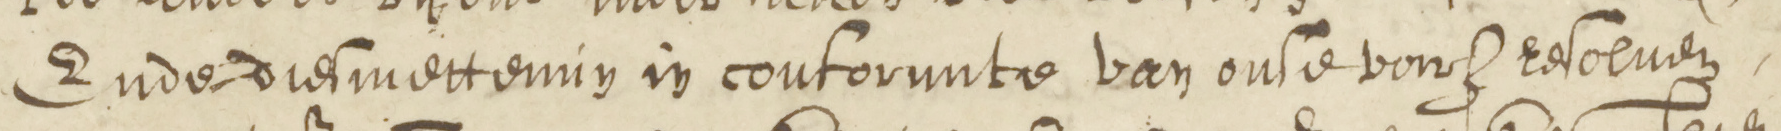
Ende diesniettemin in conformité van onse voirs resoluen,
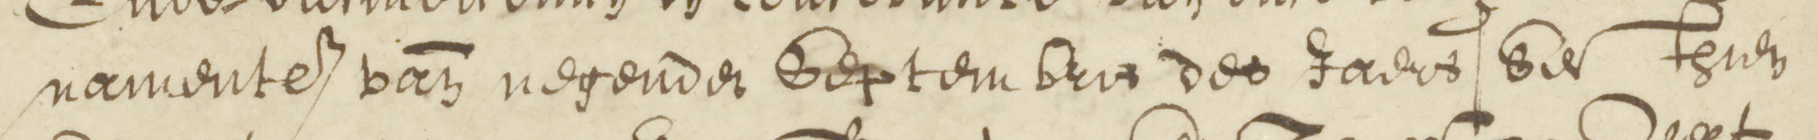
namentl van negenden Septembris des Jaers Sesthien
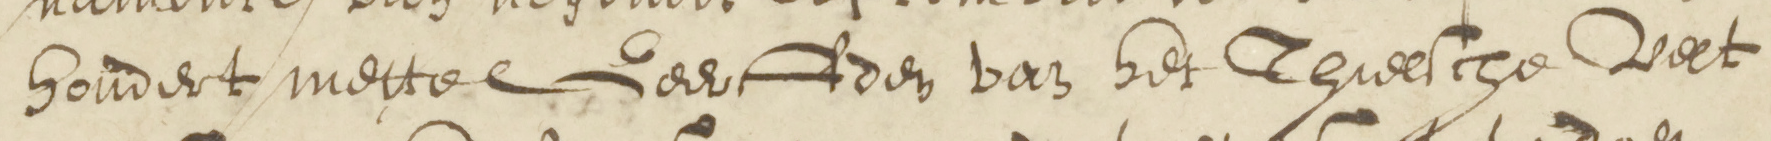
hondert mette Geerffden van het Thielsche Velt
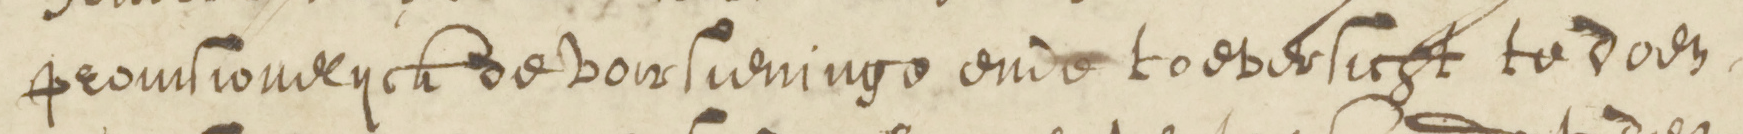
prouisionelyck de voirsieninge ende toeversicht te doen
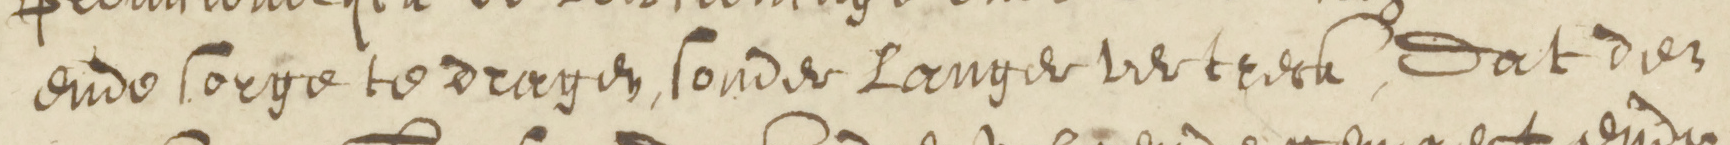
ende sorge te dragen, sonder langer vertreck, dat den
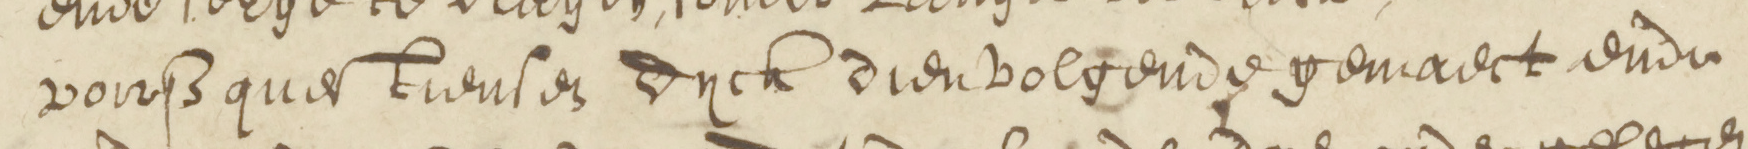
voirs questieusen dyck dienvolgende gemaect ende
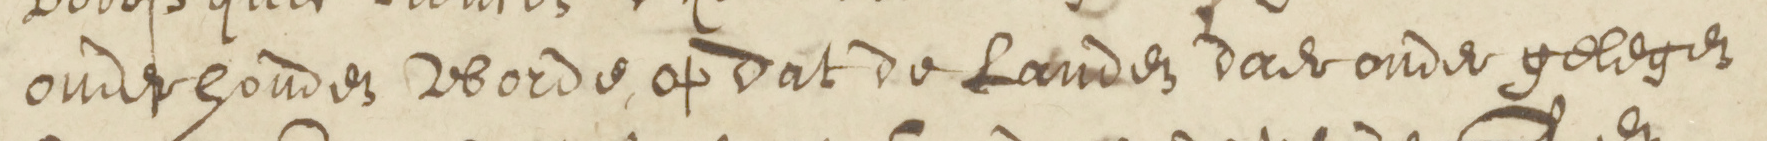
onderhouden worde op dat de landen daer onder gelegen
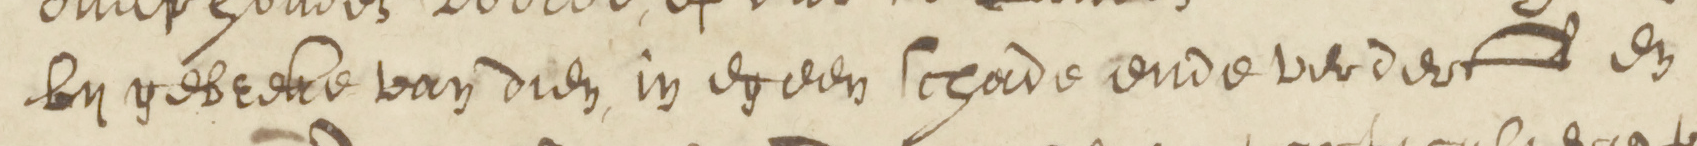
by gebreke van dien in egeen schade ende verderff en
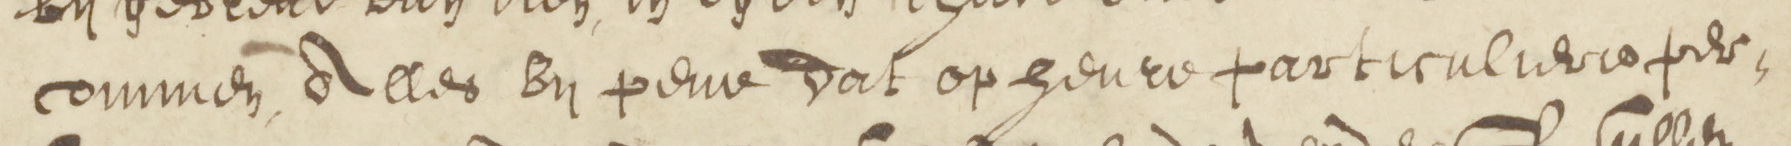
commen. Alles by pene dat op heure particuliere per„
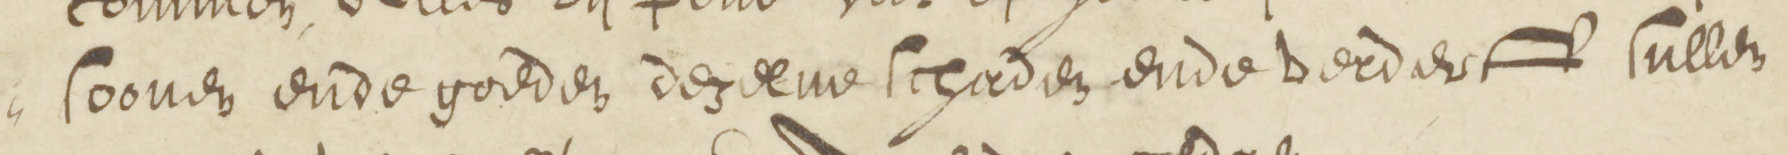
,soonen ende goeden dezelue schaden ende verderff sullen
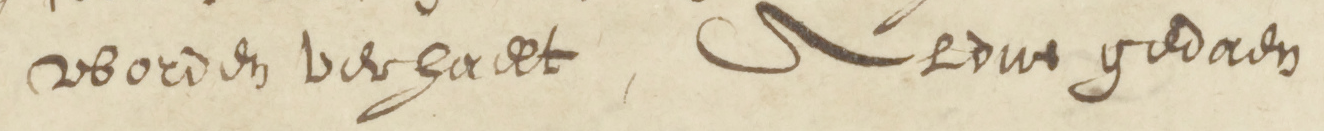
worden verhaelt. Aldus gedaen
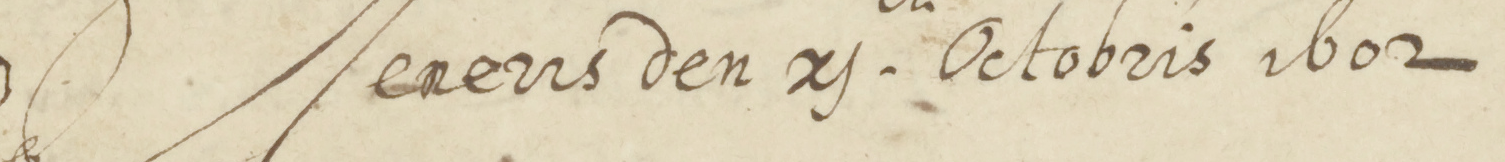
Veneris den xjen. Octobris 1602
